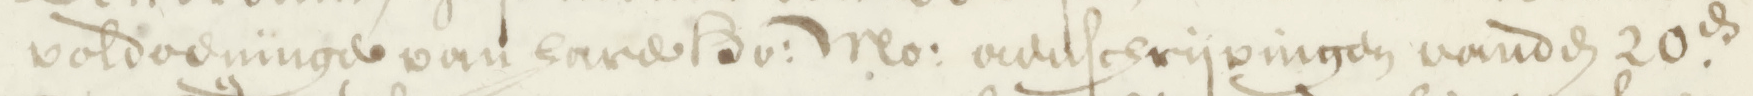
voldoeninge van hare Ho:Mo: aenschrijvingen vanden 20en.
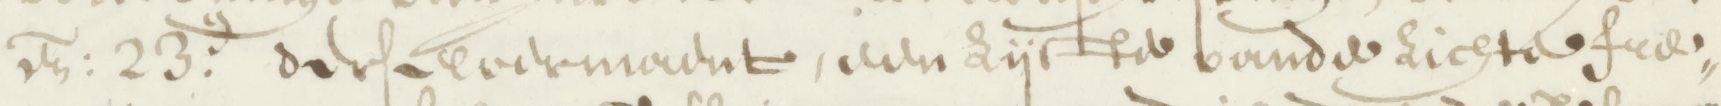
en: 23en. derselver maent, een Lijste vande Lichte fre„
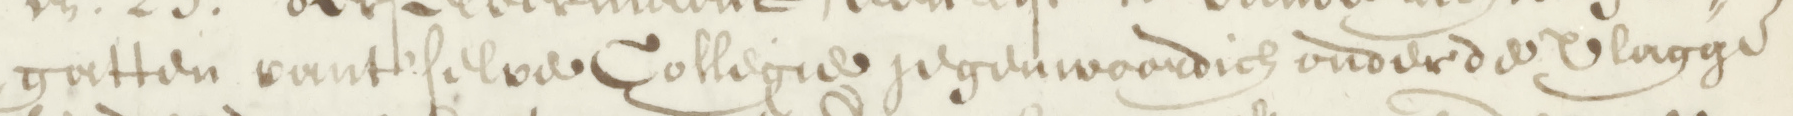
„gatten vant‛ selve Collegie jegenwoordich onder de Vlagge
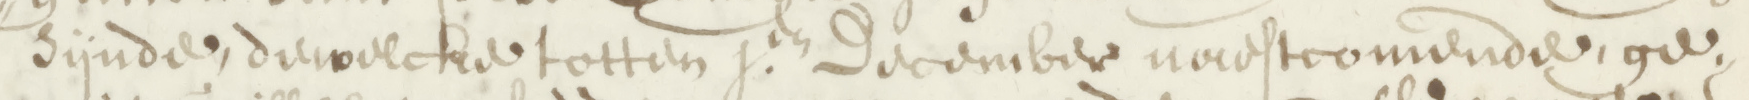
sijnde, dewelcke totten 1en. December naestcomende, ge„
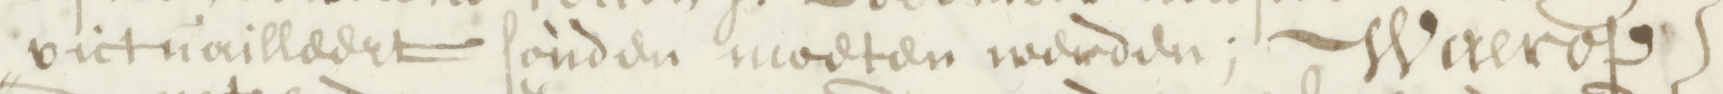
„victuailleert souden moeten werden: Waerop
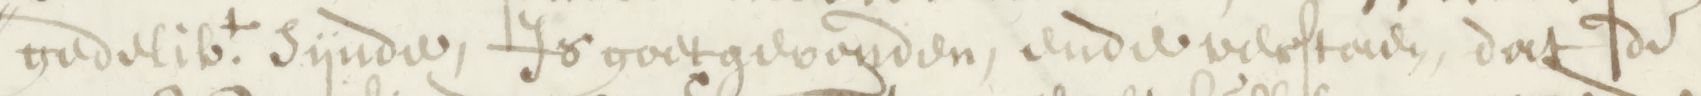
gedelibt. sijnde, Is goetgevonden, ende verstaen, dat de
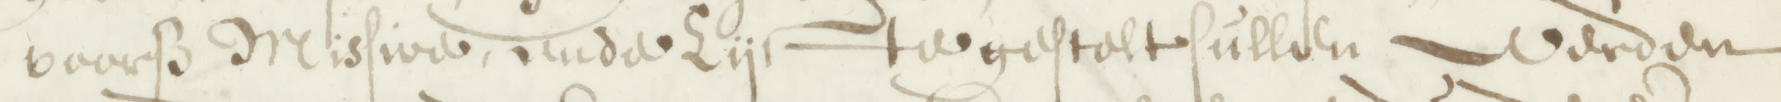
voors Missive, ende Lijste gestelt sullen Werden
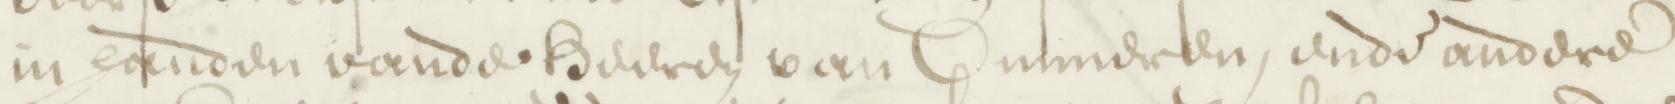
in handen vande Heeren van Ommeren, ende andere
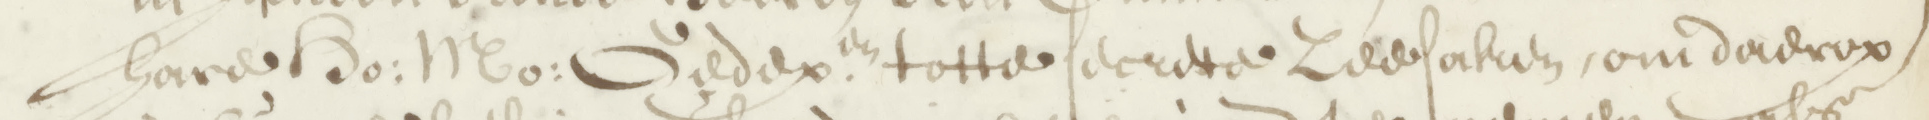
hare Ho:Mo: Gedepen. totte secrete Zeesaken, om daerop
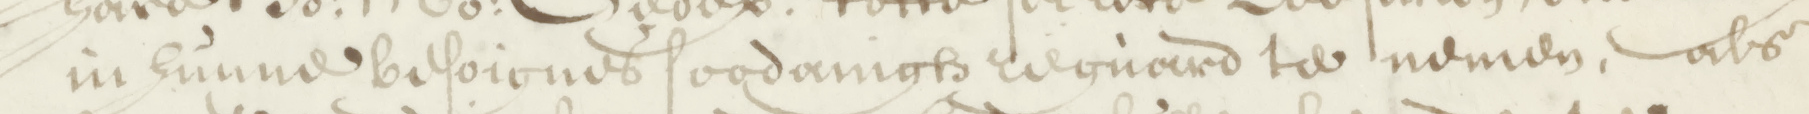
in hunne besoignes soodanigh reguard te nemen, als
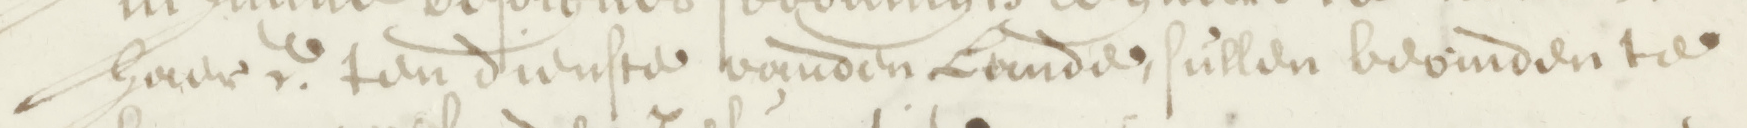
haer E. ten dienste vanden Lande, sullen bevinden te
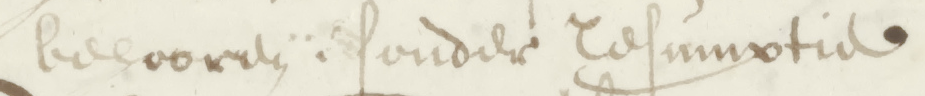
behooren, sonder Resumptie.
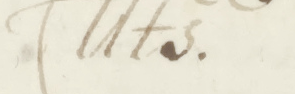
Uts.
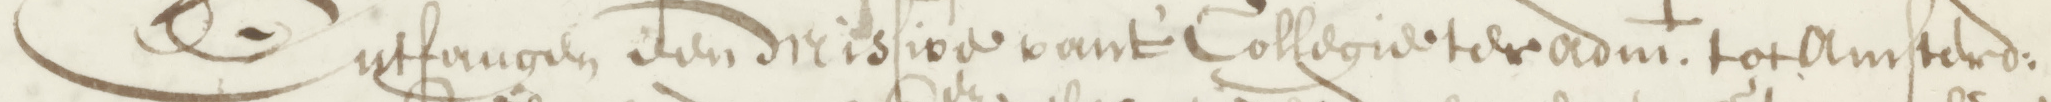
Ontfangen een Missive vant‛ Collegie ter Admt. tot Amsterd:
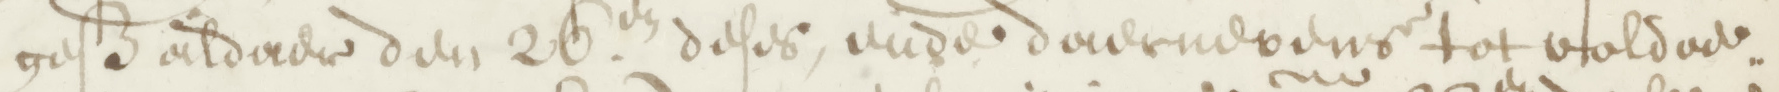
ges aldaer den 26en. deses, ende daernevens tot voldoe„
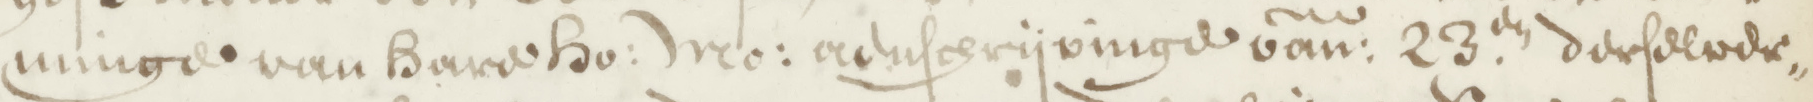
ninge van hare Ho:Mo: aenschrijvinge van 23en. derselver„
